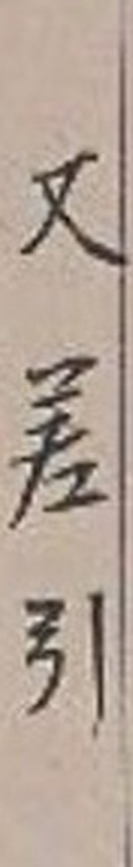又差引
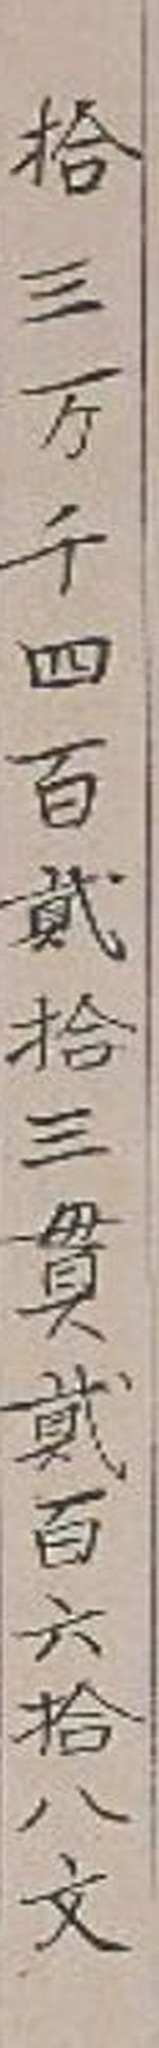拾三万千四貳拾三貫貳百六拾八文
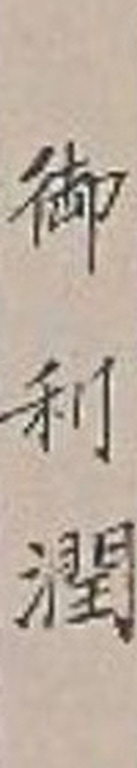御利潤
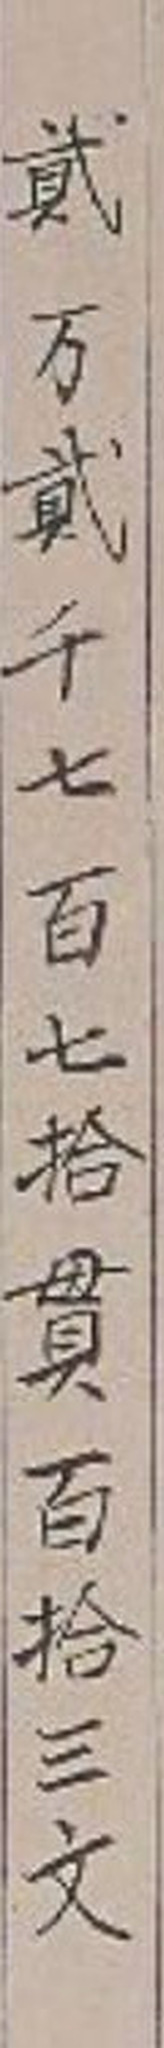貳万貳千七百七拾貫百拾三文
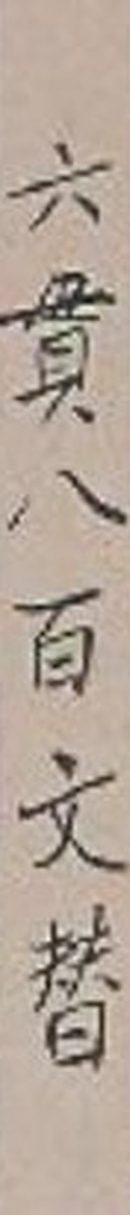六貫八百文替
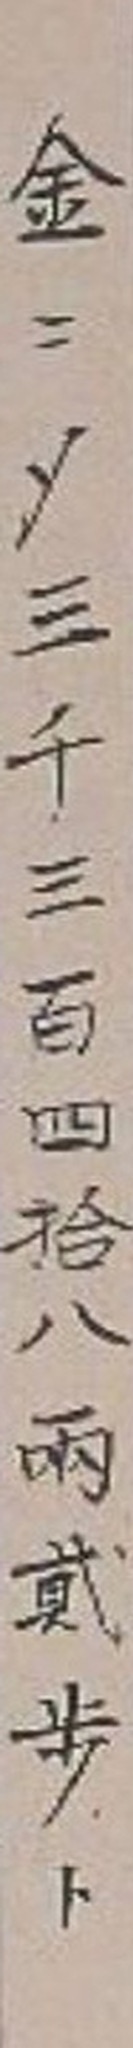金ニシテ三千三百四拾八兩貳歩ト
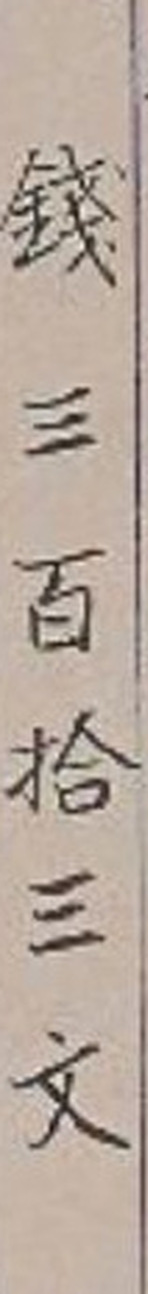錢三百拾三文
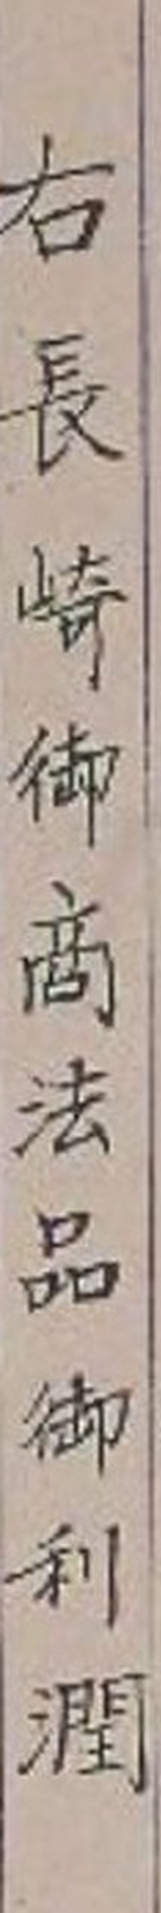右長崎御商法品御利潤
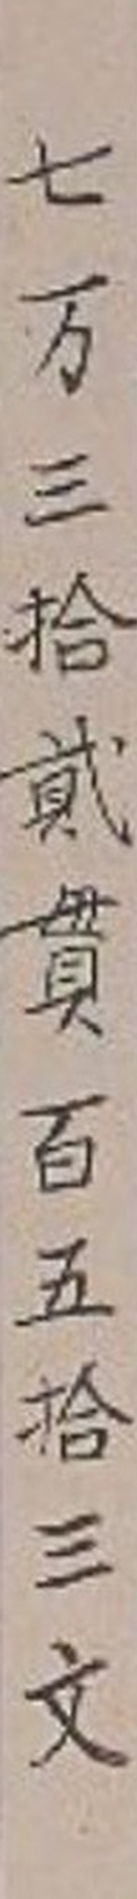七万三拾貳貫百五拾三文

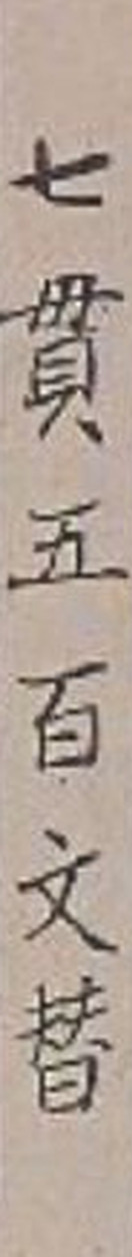七貫五百文替
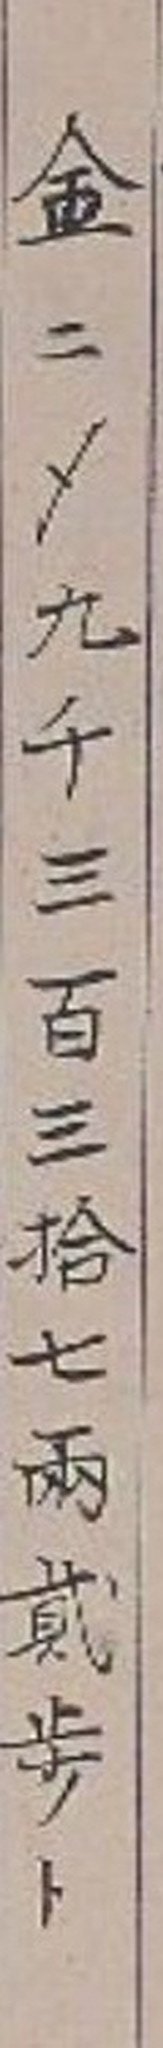金ニシテ九千三百三拾七兩貳歩ト
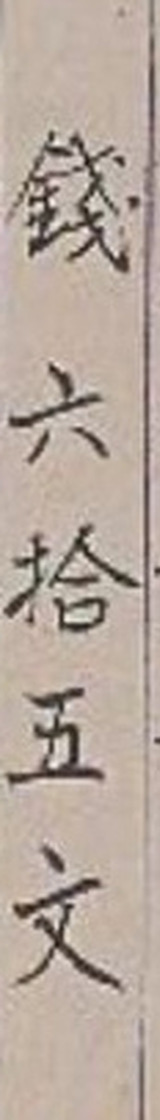錢六拾五文
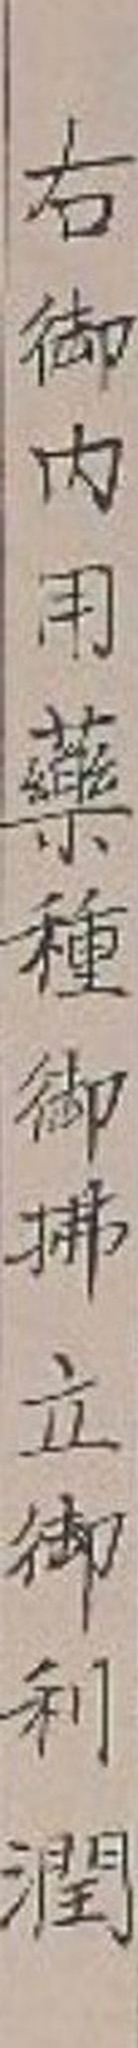右御内用薬種御拂立利潤
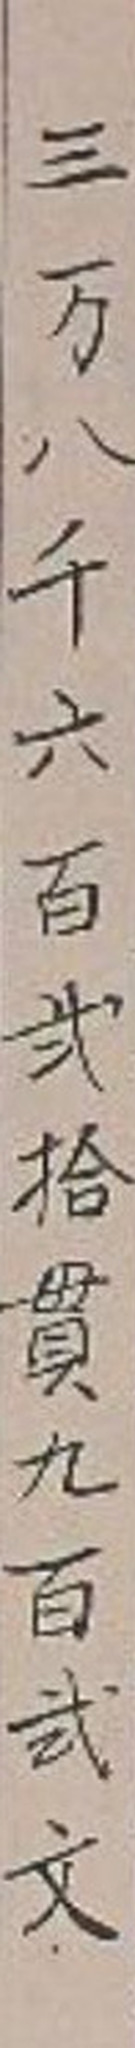三万八千六百弐拾貫九百弐文
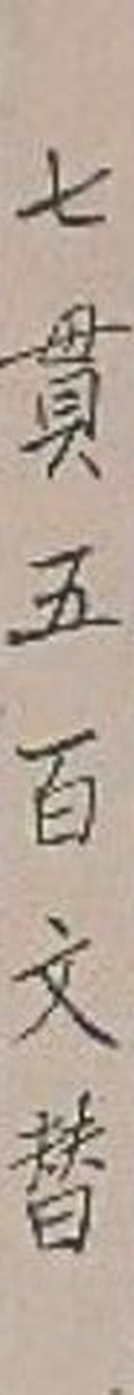七貫五百文替
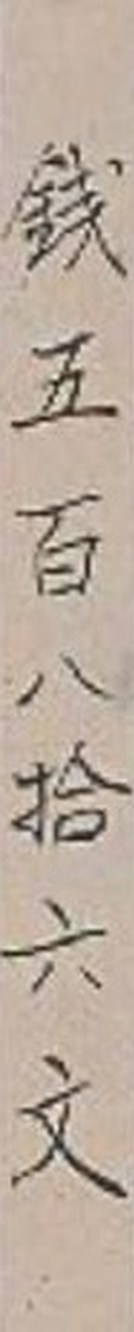錢五百八拾六文
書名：琉球産物於長崎拂立並本手品利潤総帖 弘化四年より酉年迄
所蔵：University of the Ryukyus Library
